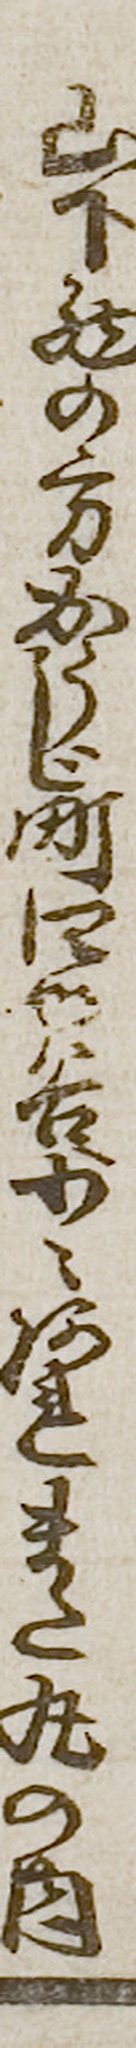山下西の方かうじ町四ツ谷少々あれまた丸の内
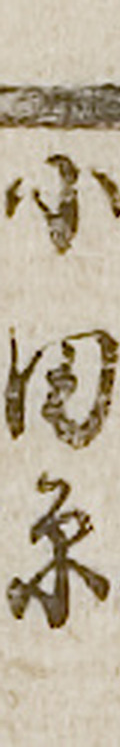小田原
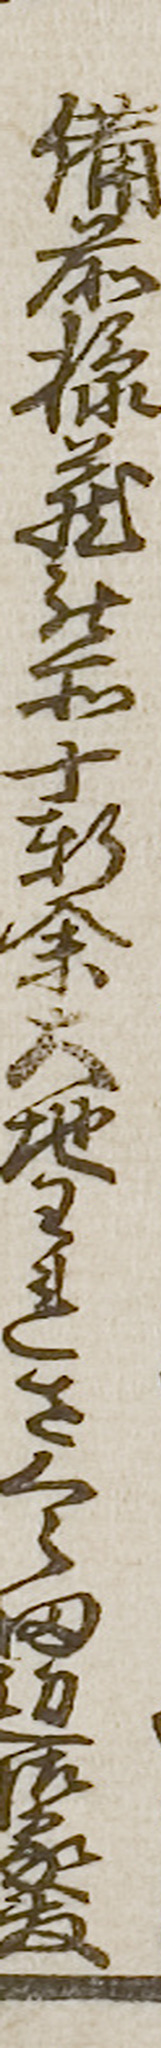備前様蔵の所十軒余大地われさくら田辺御家敷
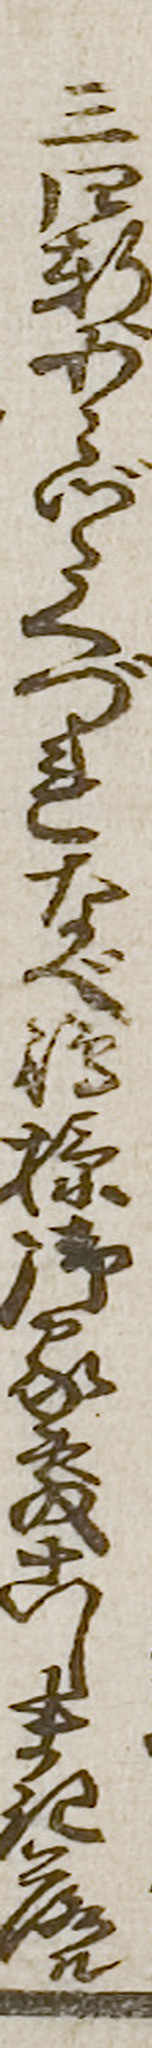三四軒少々ヅヽくづれなべ嶋様御家敷こしまき落ル
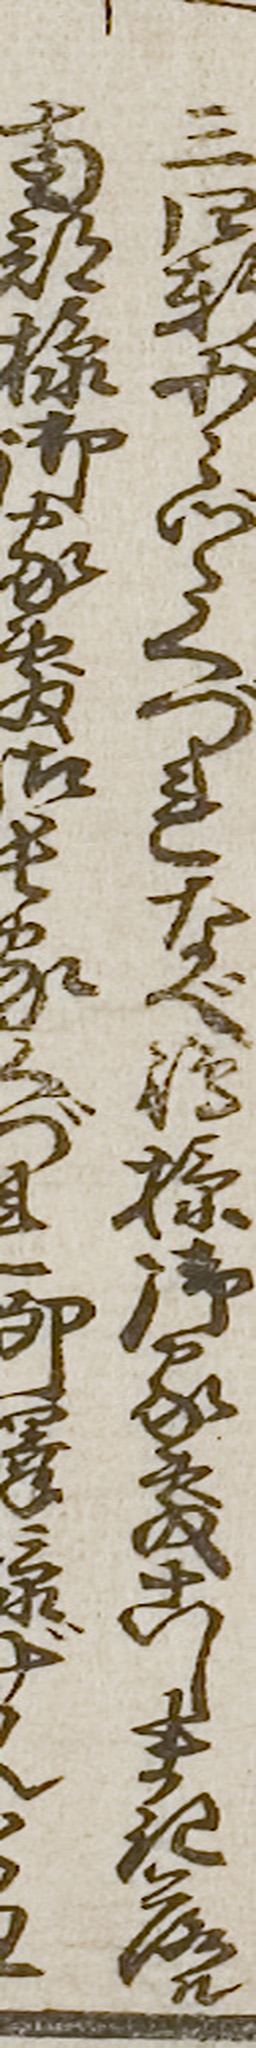南部様御家敷御長家くづれ柳澤様げんくわ
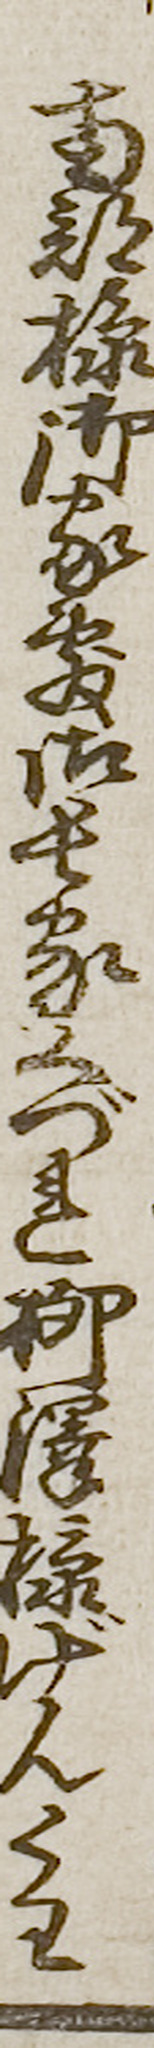南部様御家敷御長家くづれ柳澤様げんくわ
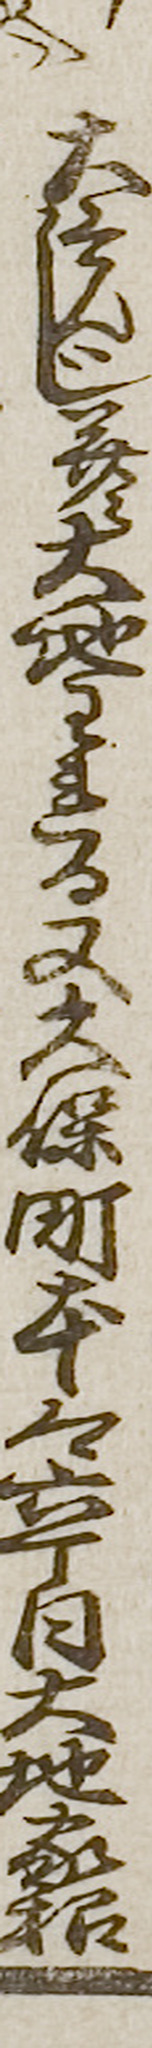大そんじ并ニ大地われる又大保町本郷六丁目大地家根
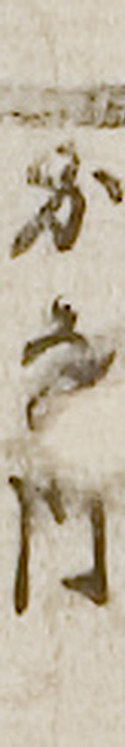かな川
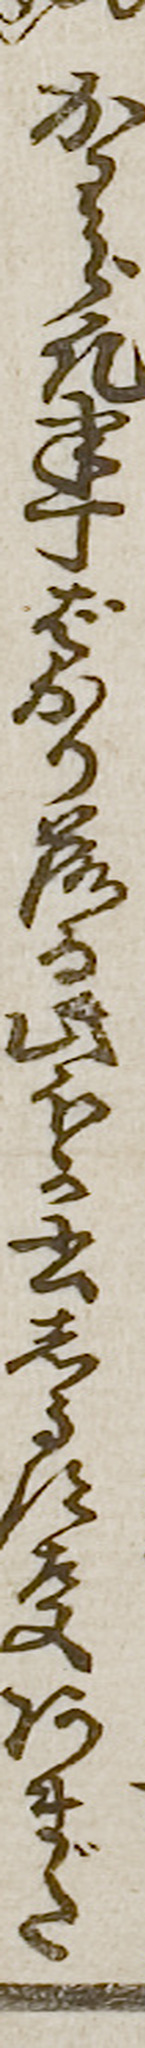かわら凡半丁ばかり落る此ほか書しるす事あまだ
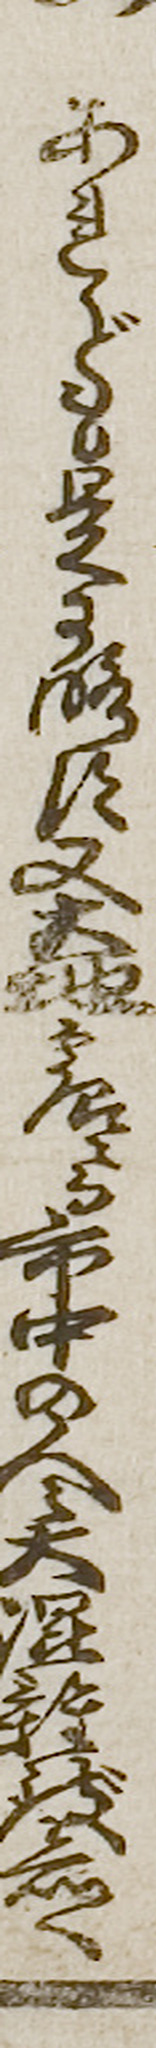あれども是に略す又大地震に而市中の人々大混雑致候所へ
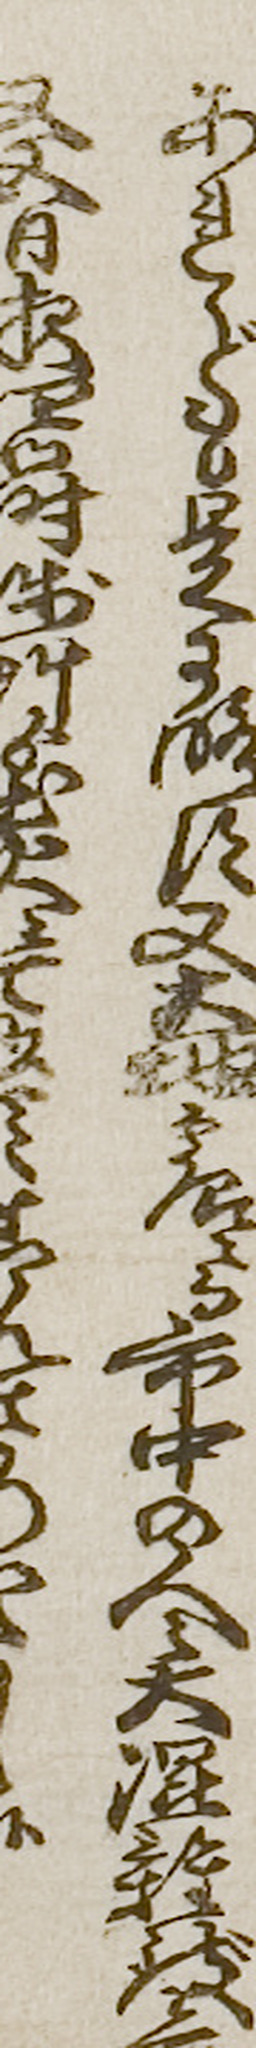又五日夜四ツ時浅艸ゟ出火にて少々こんさついたし候
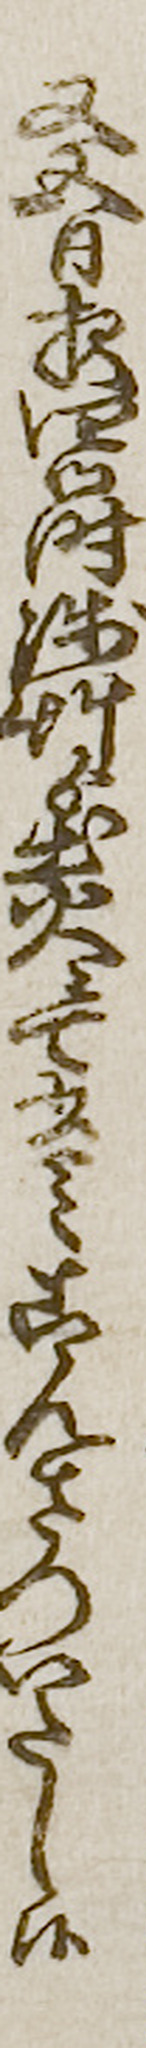又五日夜四ツ時浅艸ゟ出火にて少々こんさついたし候
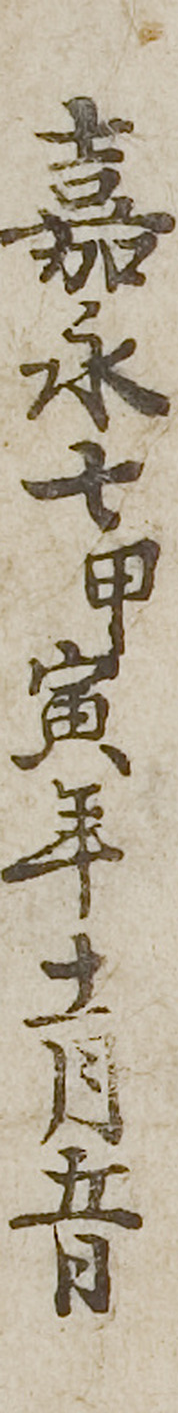嘉永七甲寅十一月四日五日
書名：江戸大地震出火之図
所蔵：東京大学総合図書館 General Library in the University of Tokyo, JAPAN
